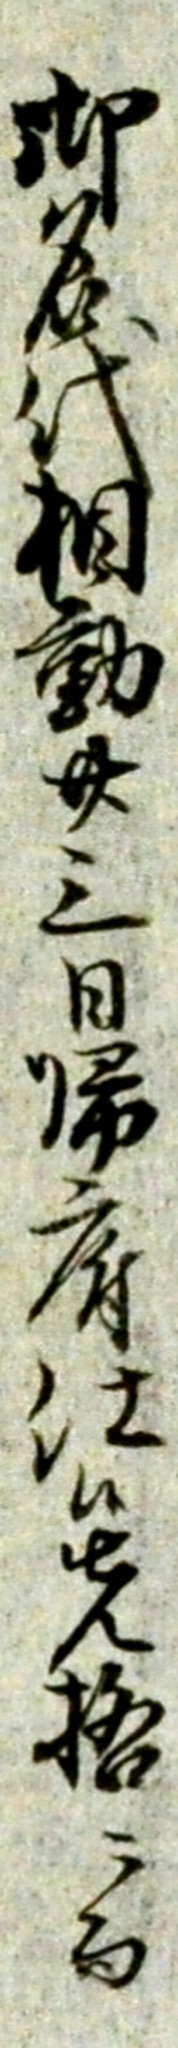御名代相勤廿三日帰府仕候先格ニ而
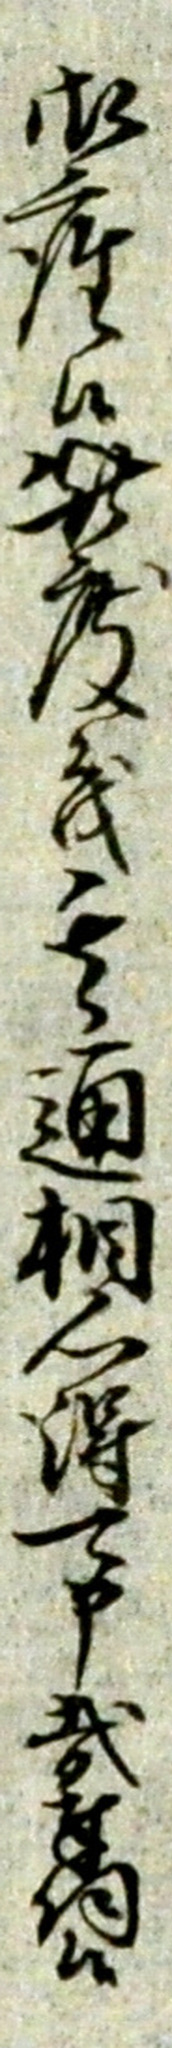御座候此度も其通相心得可申哉奉伺候
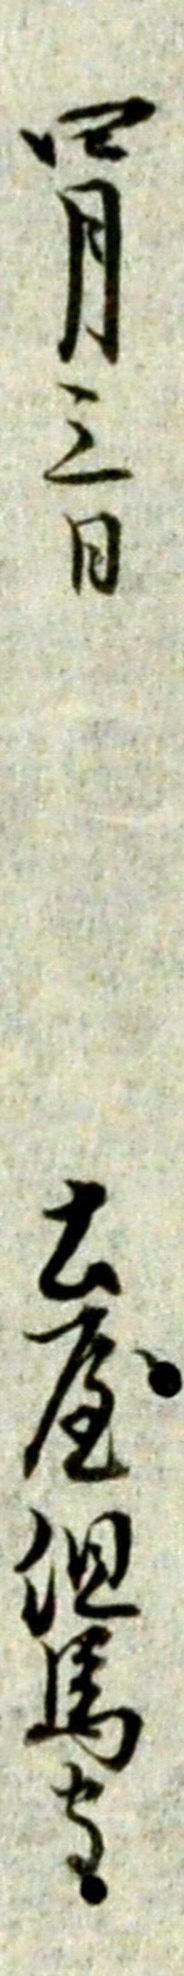四月三日土屋但馬守
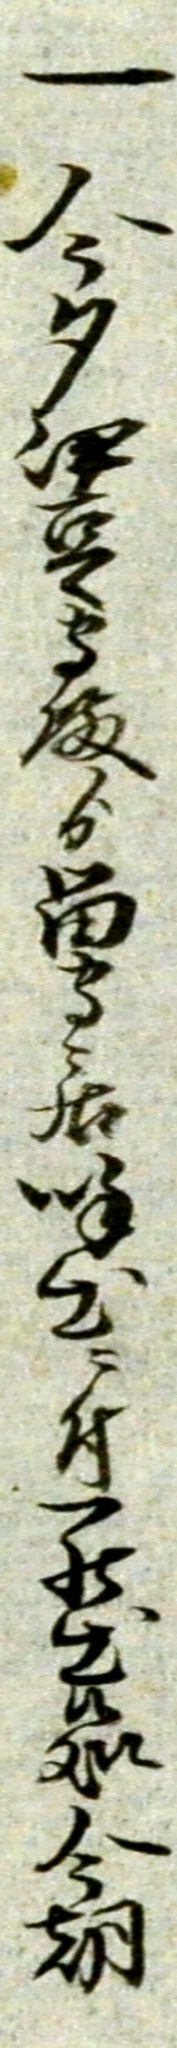一今夕伊豆守殿ゟ留守居呼出ニ付罷出候処今朝
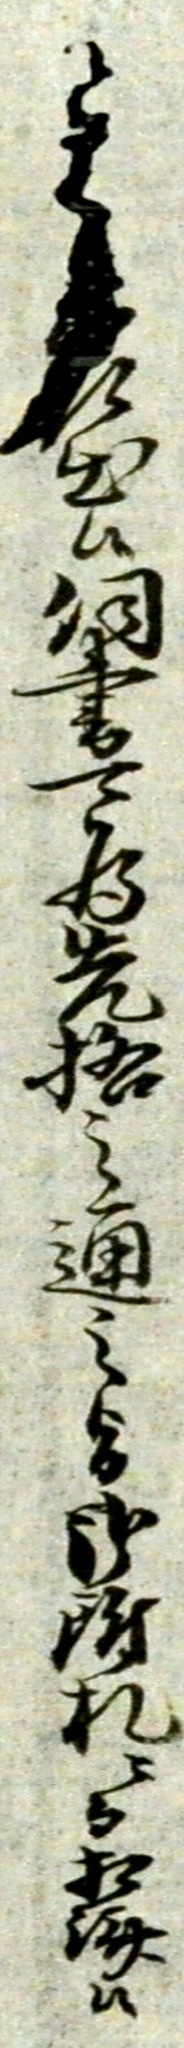差出候伺書可為先格之通之旨御附札ニ而相済候
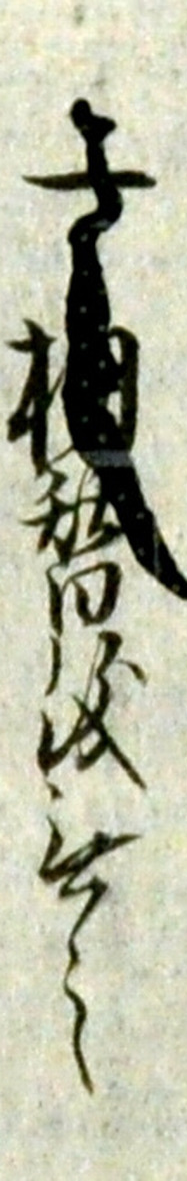相替儀無之

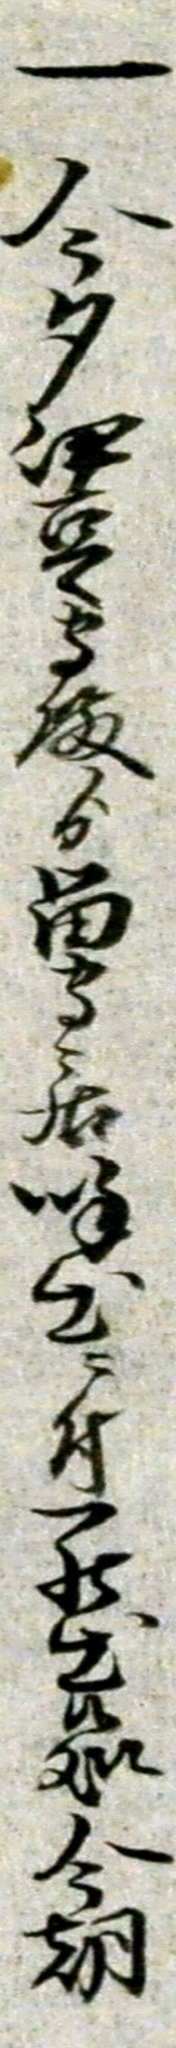一今夕伊豆守殿ゟ留守居呼出ニ付罷出候処今朝
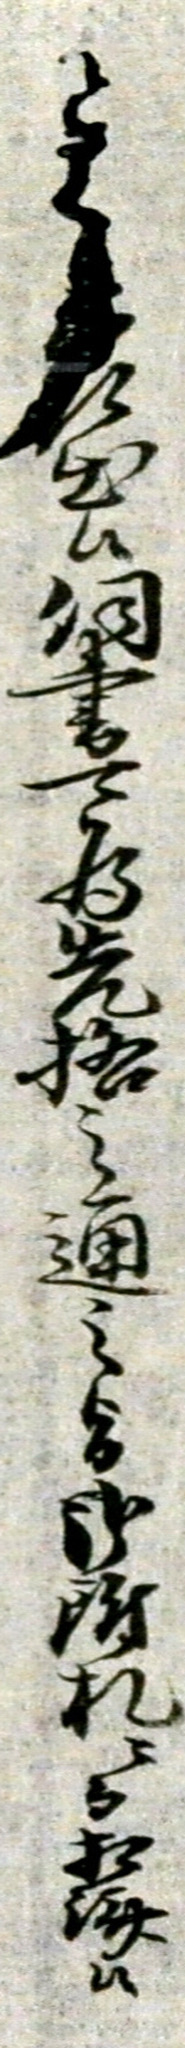差出候伺書可為先格之通之旨御附札ニ而相済候
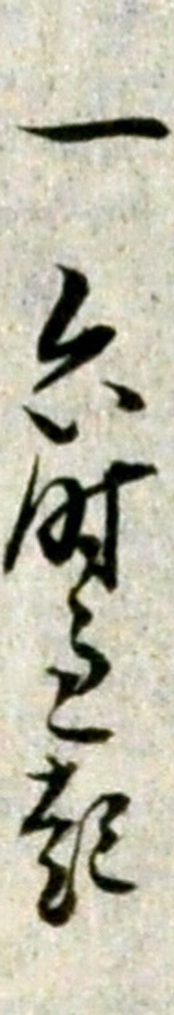一六時過起
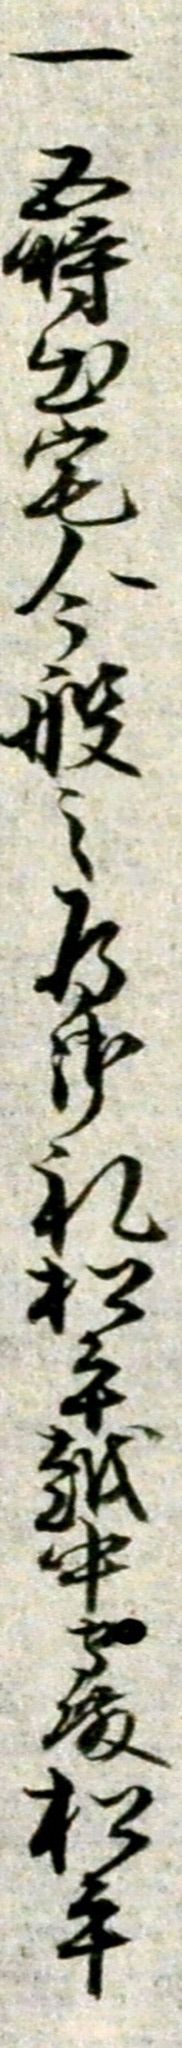一五時出宅今般之為御礼松平越中守殿松平
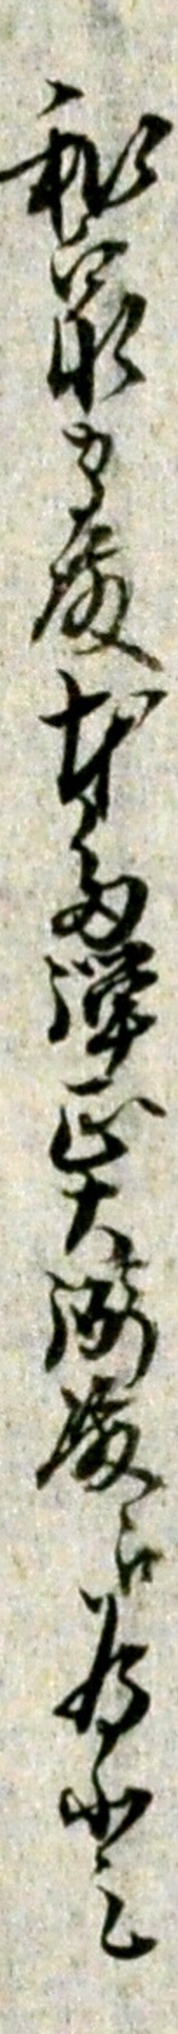和泉守殿本多弾正大弼殿江為登
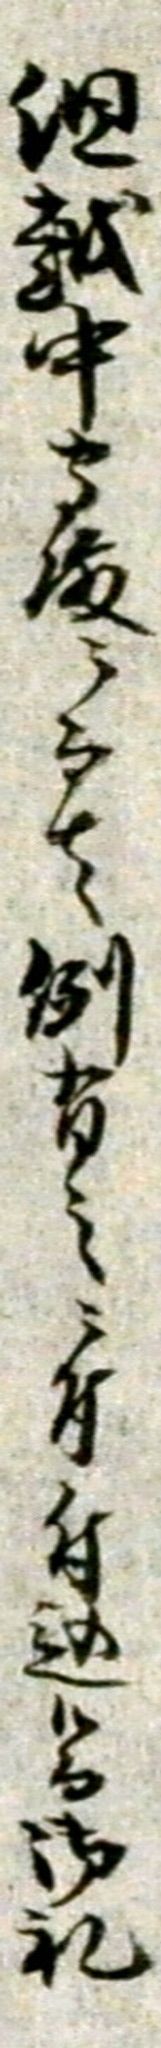但越中守殿ニ而者例有之ニ付付込候而御礼
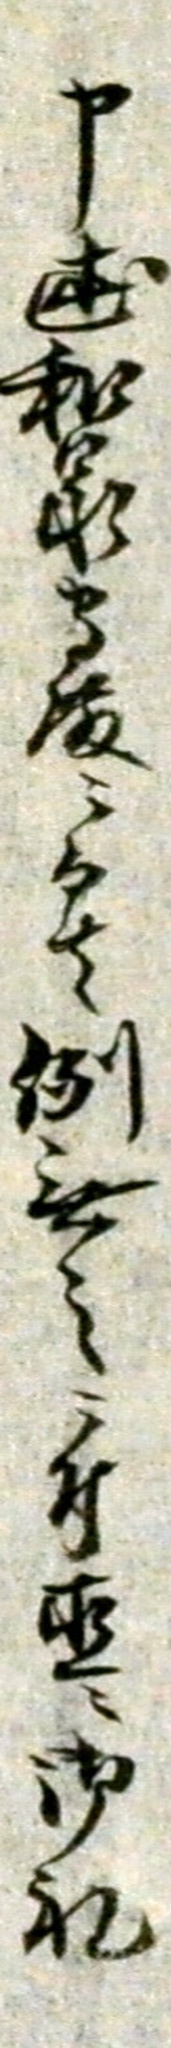申述和泉守殿ニ而者例無之に付直ニ御礼
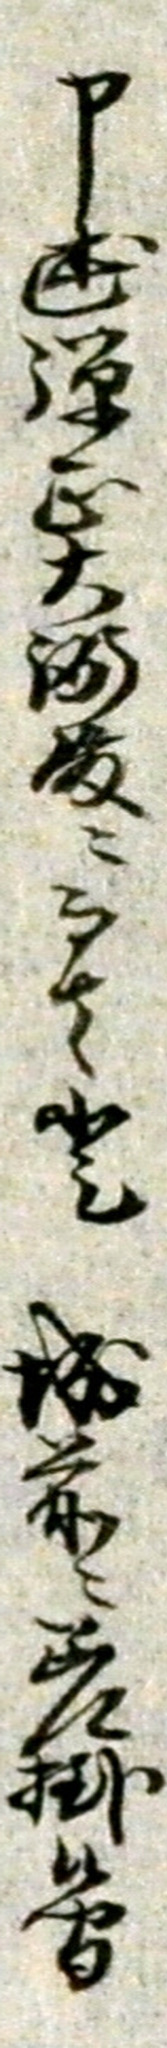申述弾正大弼殿ニ而者登城前ニ差掛候間
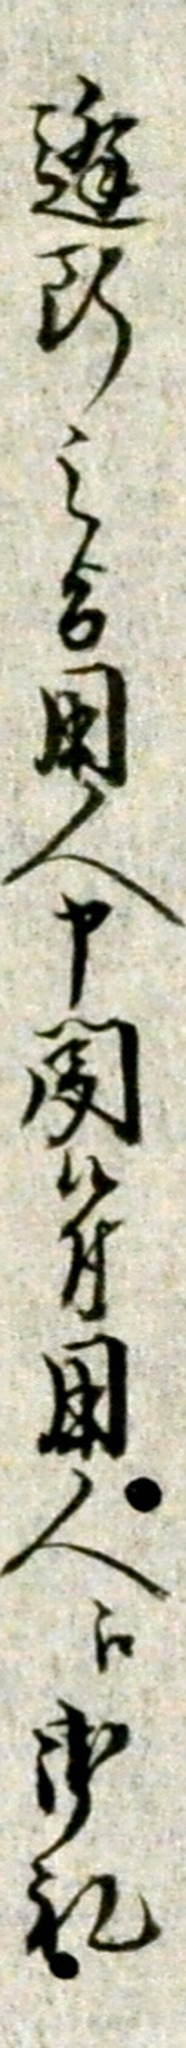逢断之旨用人申聞候付用人江御礼
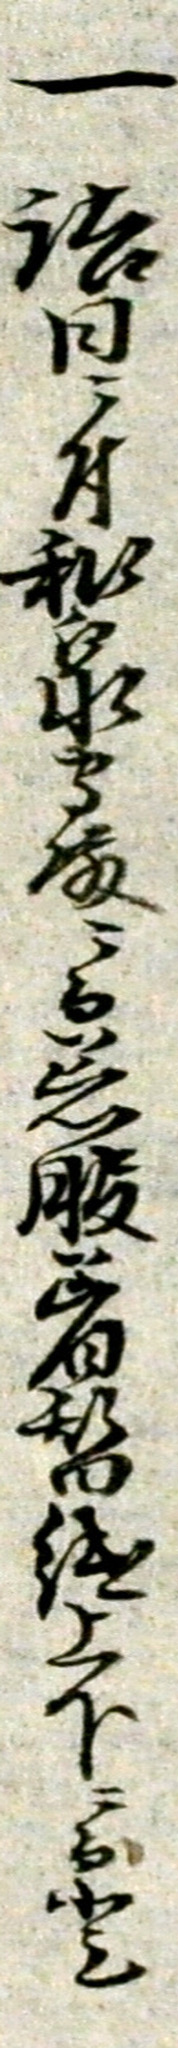一詰日ニ付和泉守殿ニ而着服着替継上下ニ而登
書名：日光御名代相勤候節ノ留
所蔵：伊那市立高遠町図書館・合同会社AMANE
